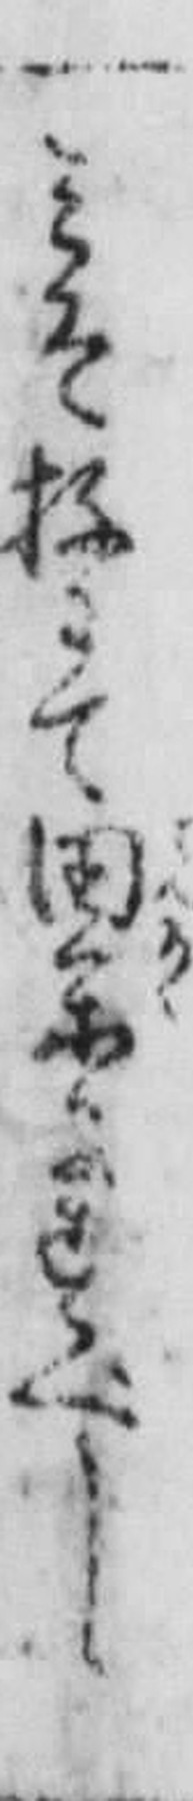みそ拵にて田楽にすべし
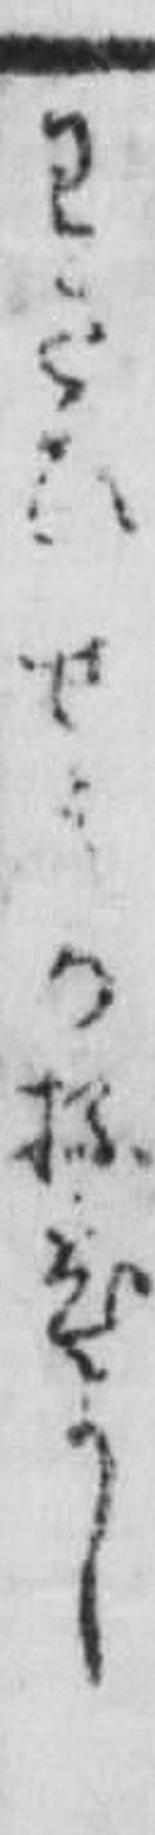わさひせうか抔尤よし
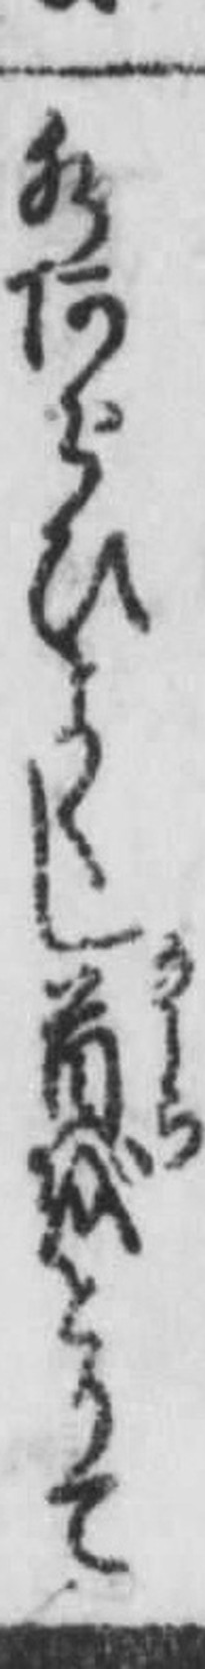水あらひよくし小口よりざく

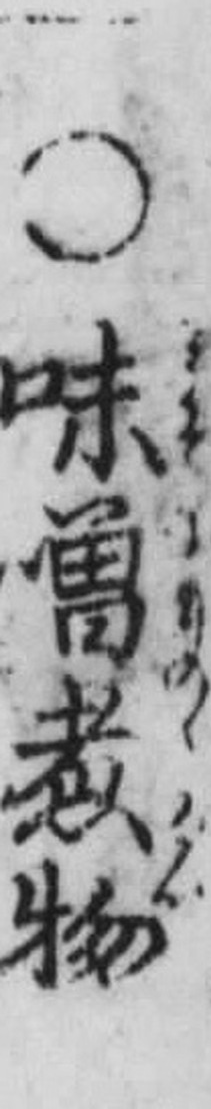○味噌煮物
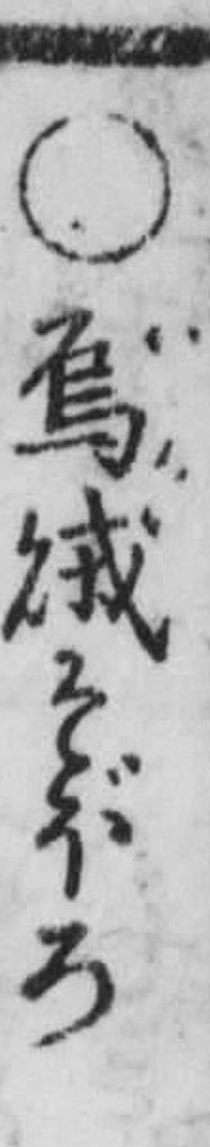○烏賊そぼろ
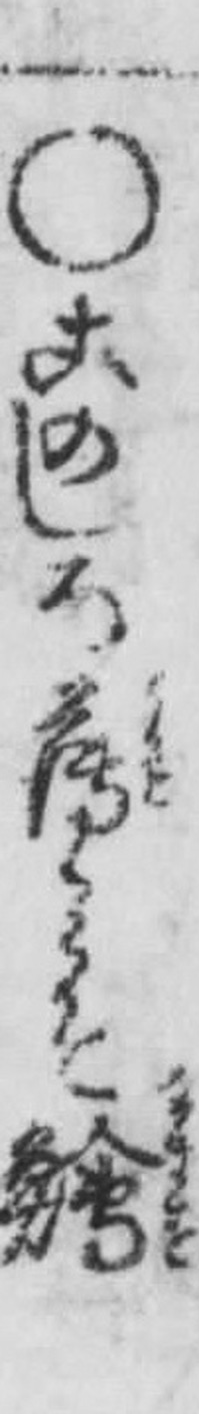○このしろ薄みそ鱠
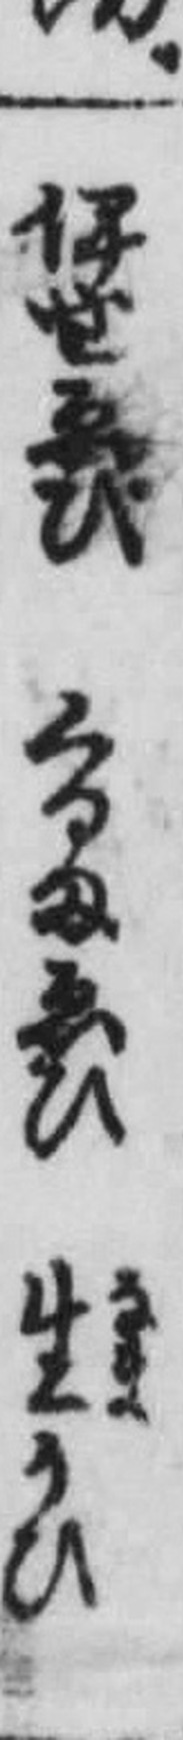いせゑびくるまゑひ生かひ
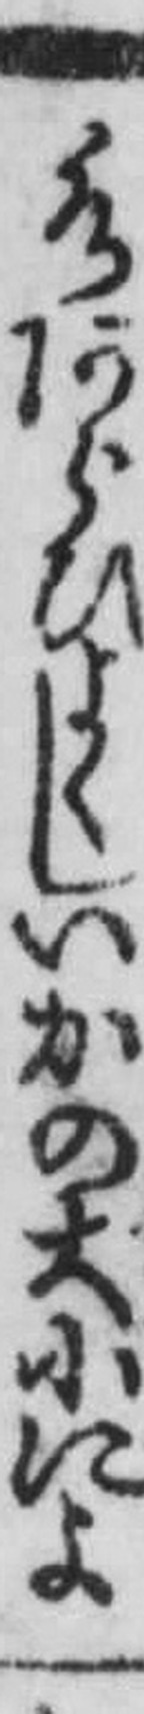水あらひよしくいかの大小によ
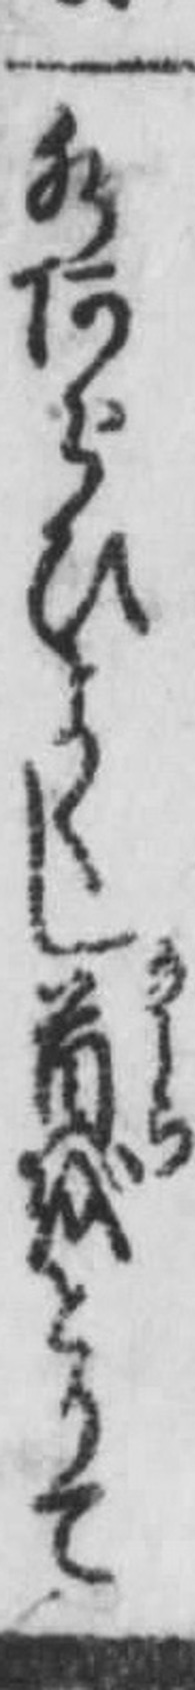水あらひよくし首をとりて
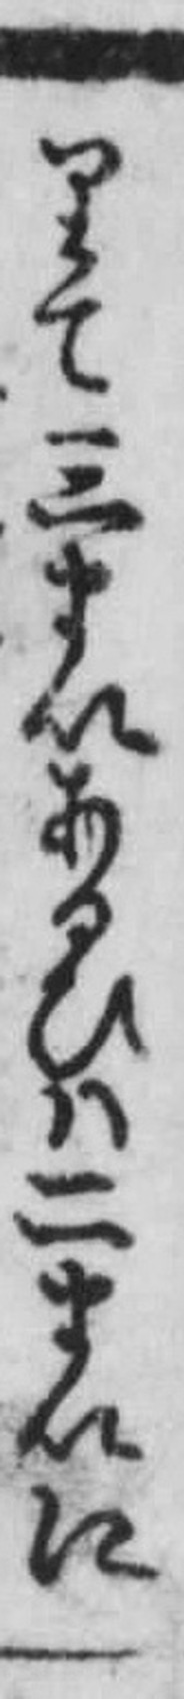りて三まいあるひは二まいに
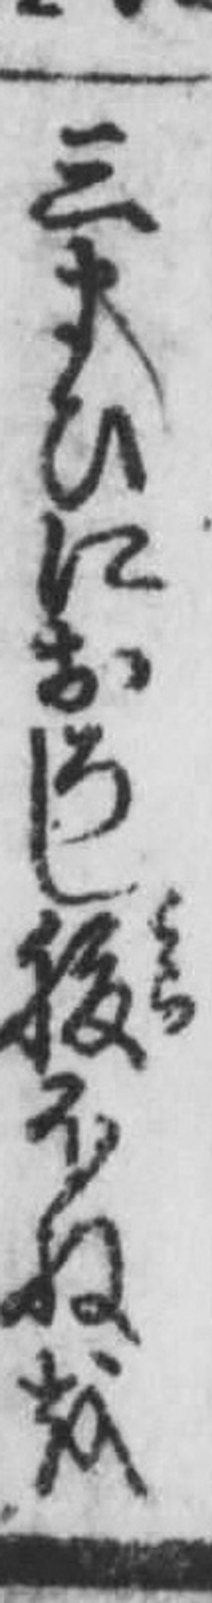三まひにおろし腹ほねを
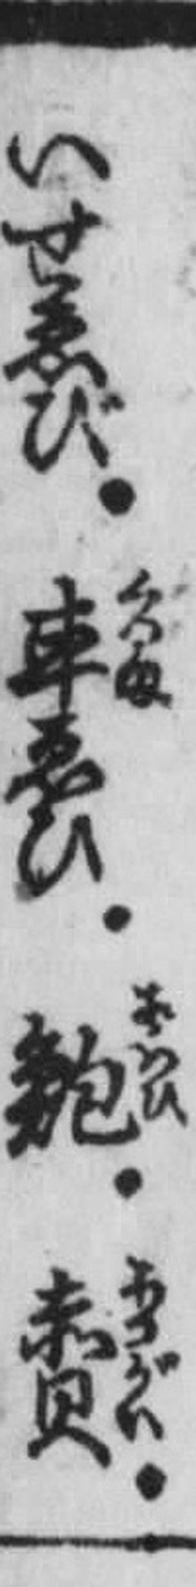いせえび。車ゑひ。鮑。赤貝。
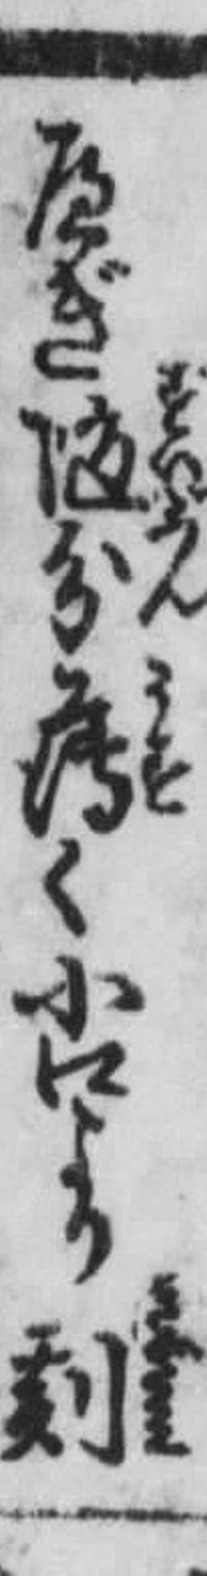へぎ随分薄く小口より刻
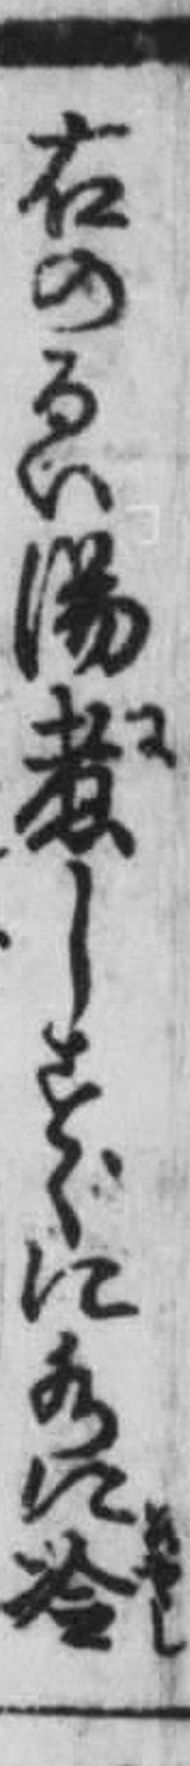右のるい湯煮してすぐに水に冷
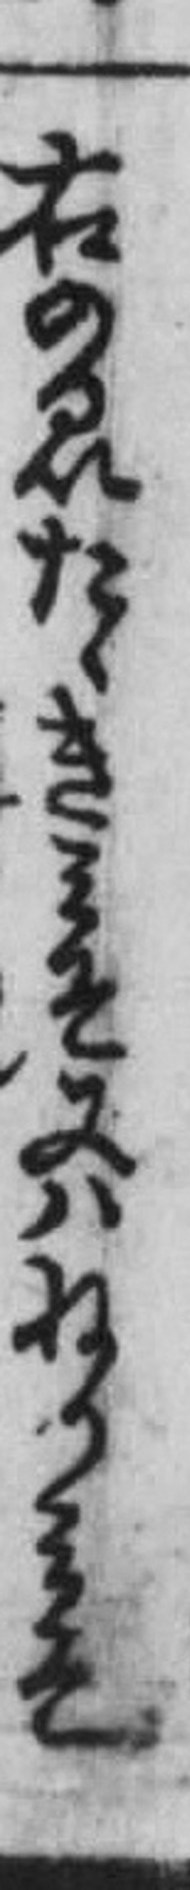右のるいたゝきみそ又はねりみそ
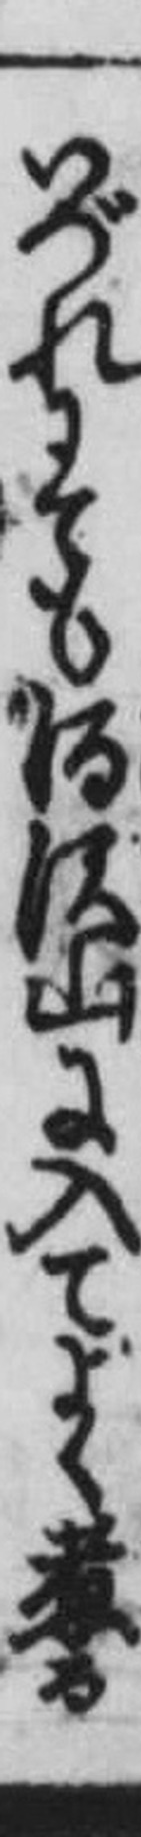いづれにても酒沢山に入てよく煮る
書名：精進魚類間合料理/早速庖丁
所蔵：大阪府立大学学術情報センター 国文学研究資料館
